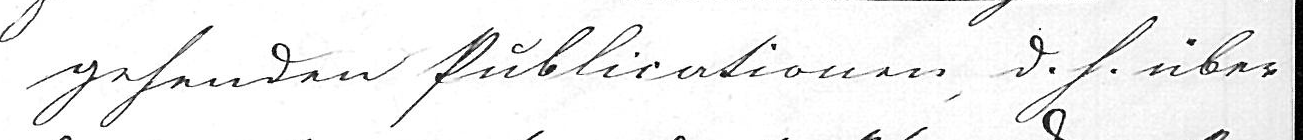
gehenden Publicationen, d.h. über
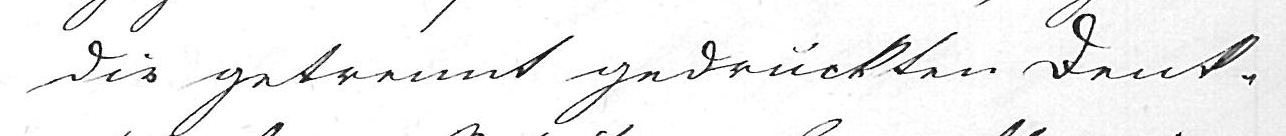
die getrennt gedruckten Denk-
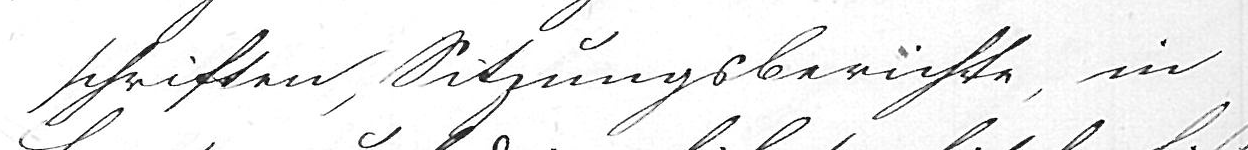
schriften, Sitzungsberichte, in
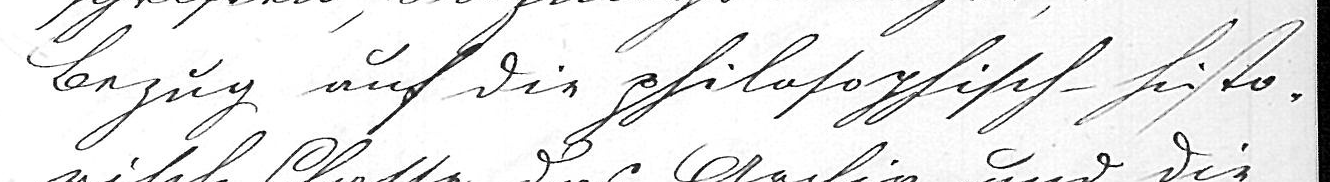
Bezug auf die philosophisch-histo-
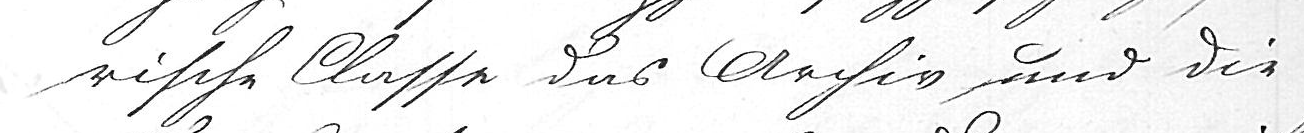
rische Classe das Archiv und die
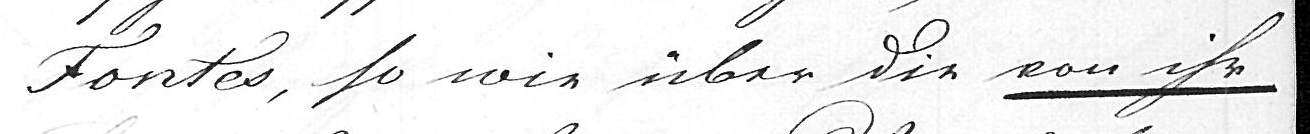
Fontes, so wie über die von ihr
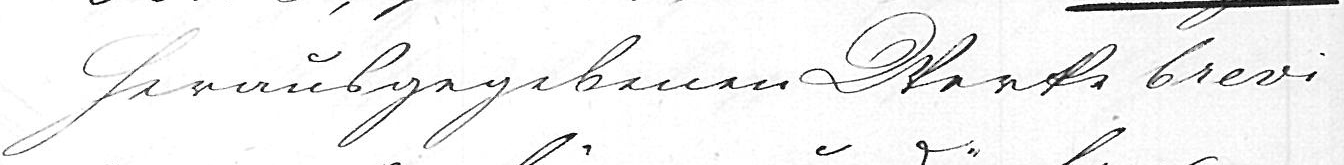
herausgegebenen Werke brevi
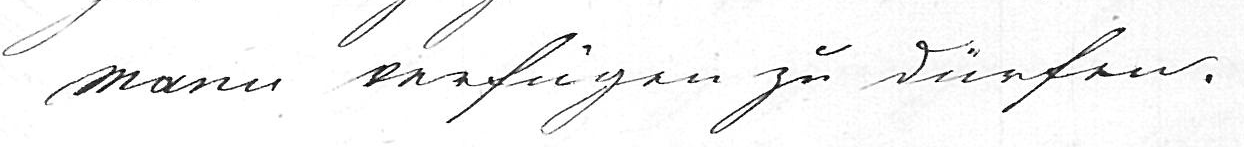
manu verfügen zu dürfen.
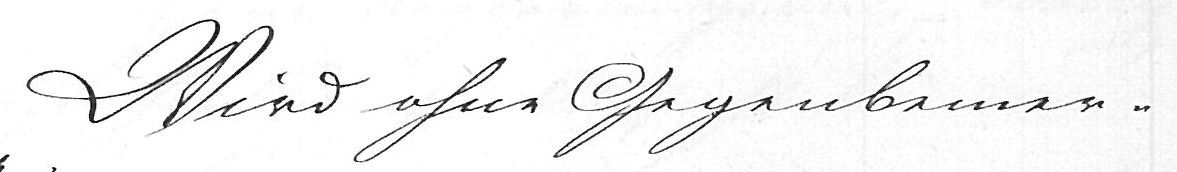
Wird ohne Gegenbemer-
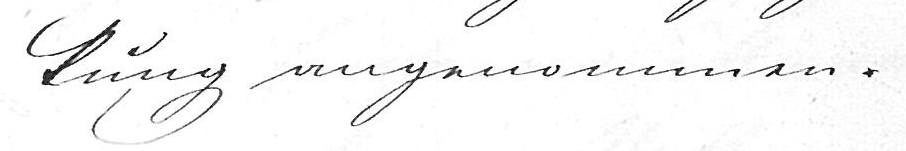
kung angenommen.
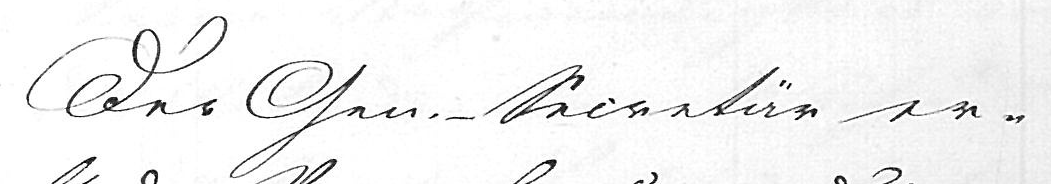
Der Gen.-Secretär er-
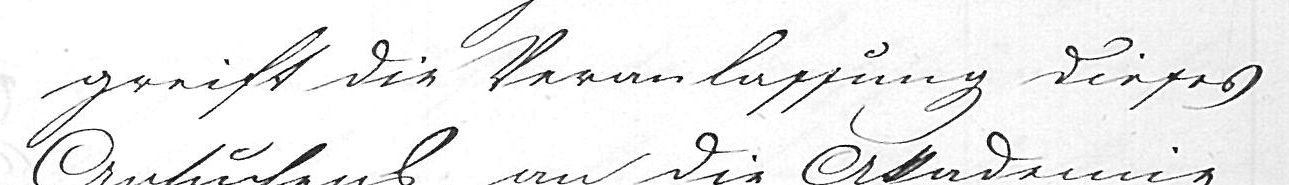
greift die Veranlassung dieses
